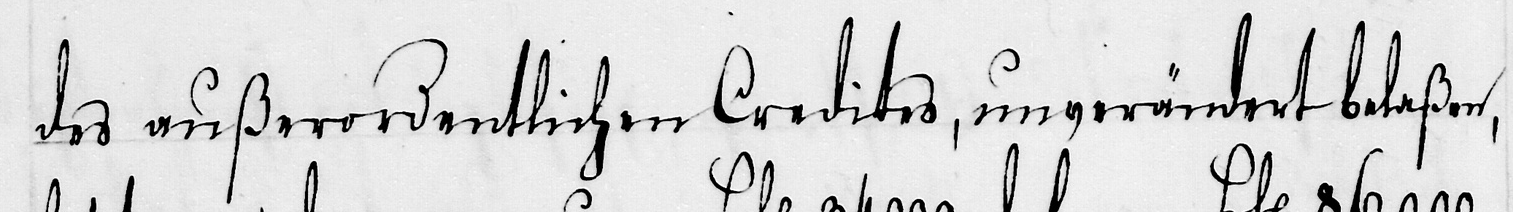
des außerordentlichen Credites, unverändert belaßen,
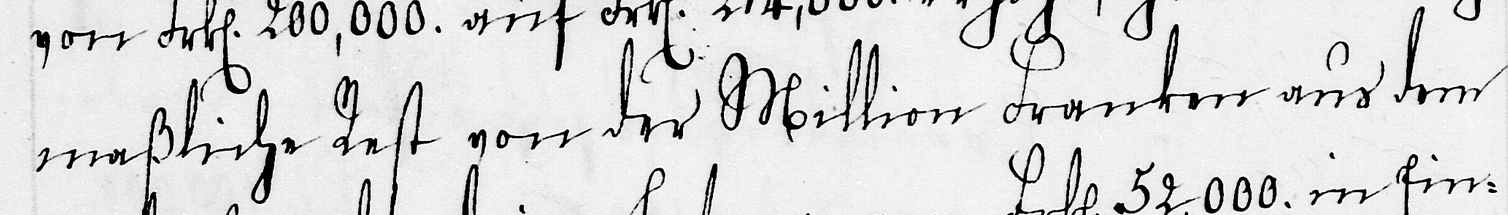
maßliche Rest von der Million Franken aus dem
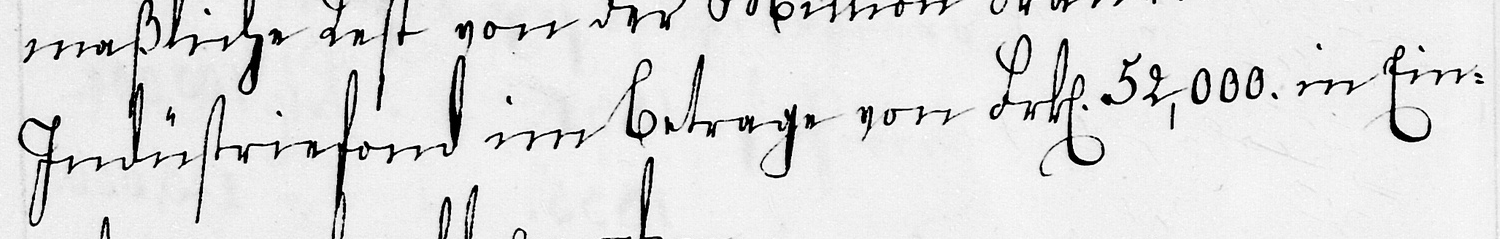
Indüstriefond im Betrage von Frk[en]. 52,000. in Ein¬
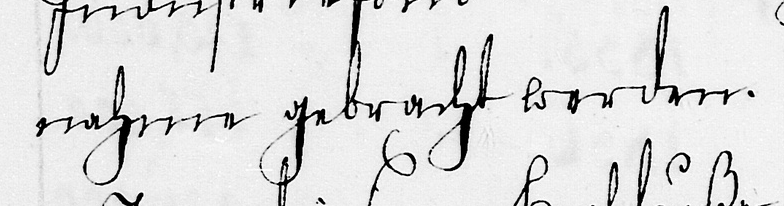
nahme gebracht werden.
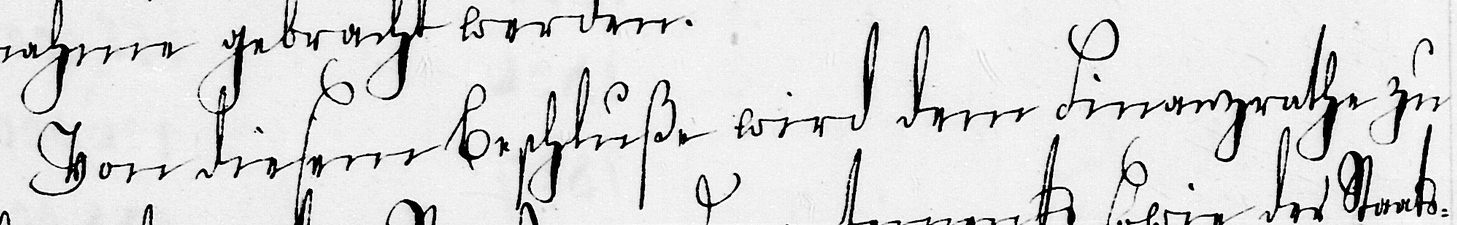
Von diesem Beschluße wird dem Finanzrathe zu
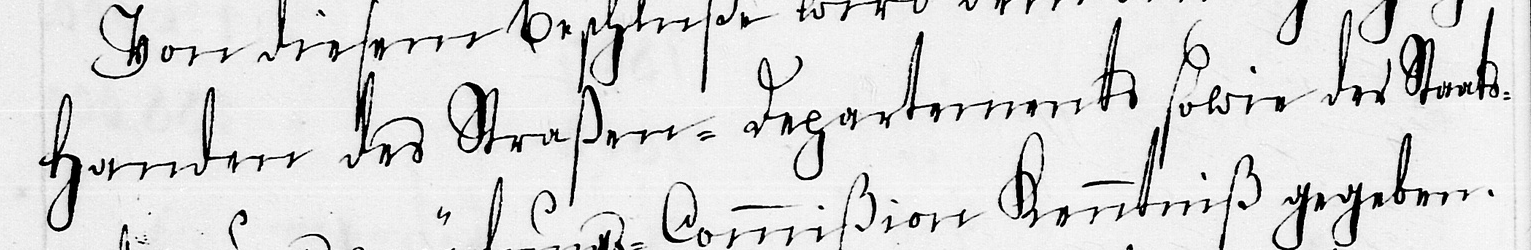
Handen des Straßen-Departements sowie der Staa¬
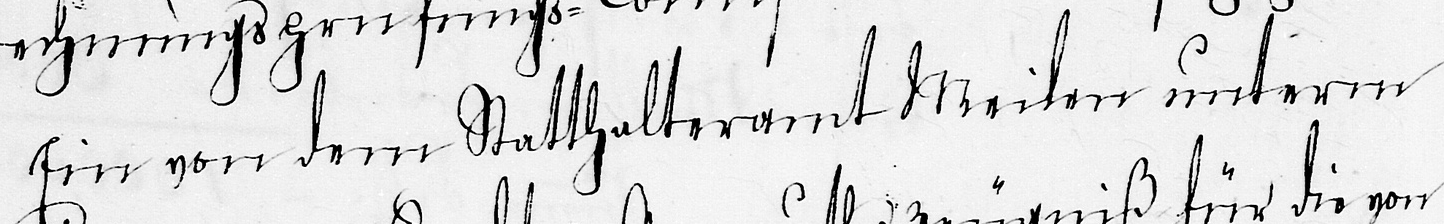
Ein von dem Statthalteramt Meilen unterm
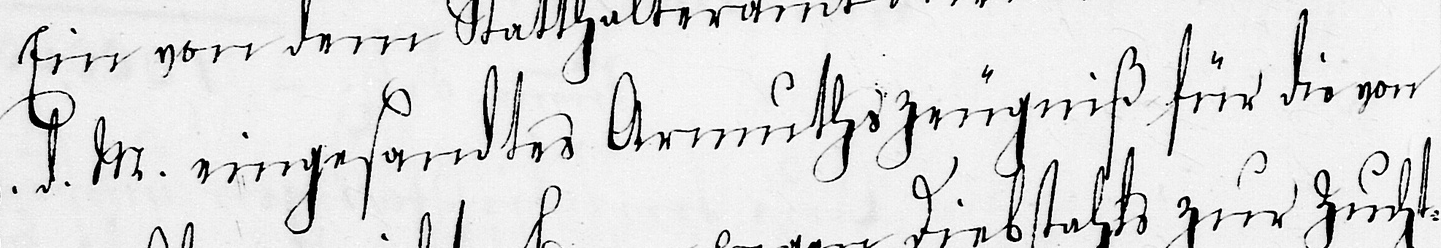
d. M. eingesandtes Armuthszeugniß für die von
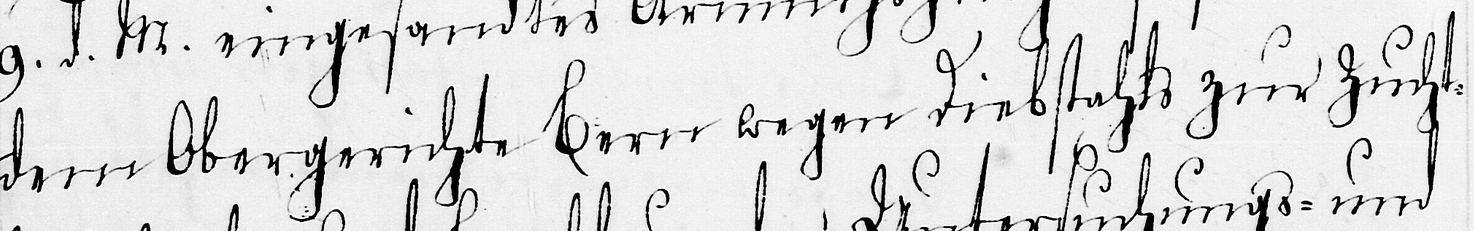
dem Obergerichte Bern wegen Diebstahls zur Zuch¬
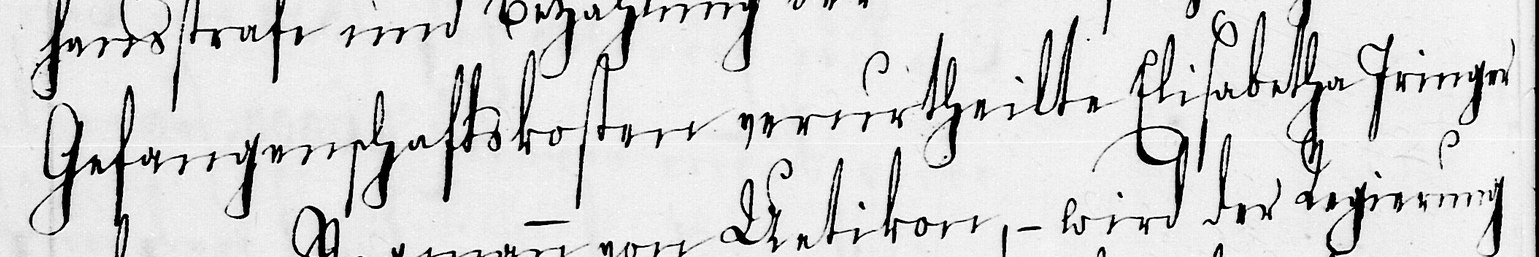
Gefangenschaftskosten verurtheilte Elisabetha Iringer
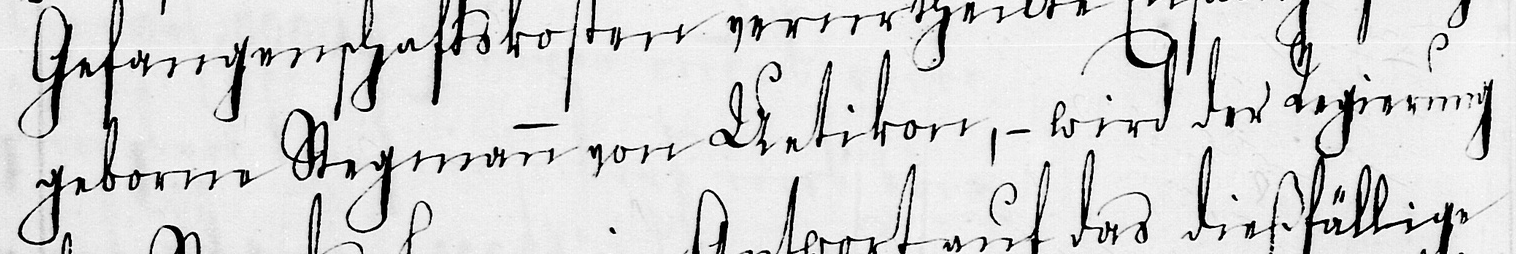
geborne Stegmann von Uetikon, – wird der Regierung
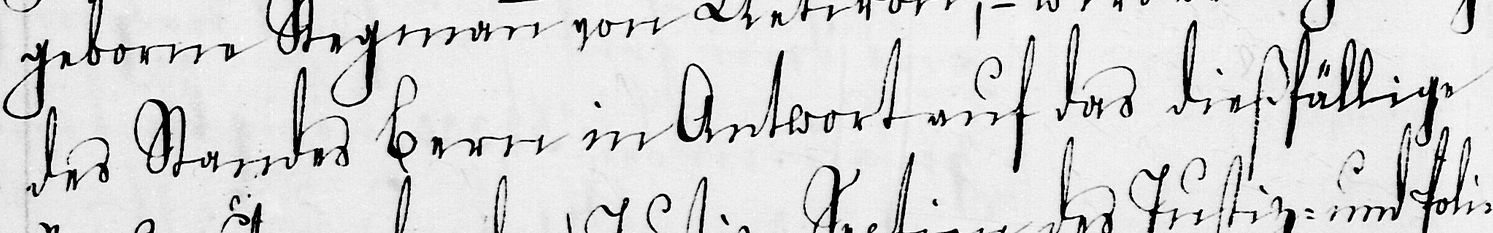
des Standes Bern in Antwort auf das dießfällige
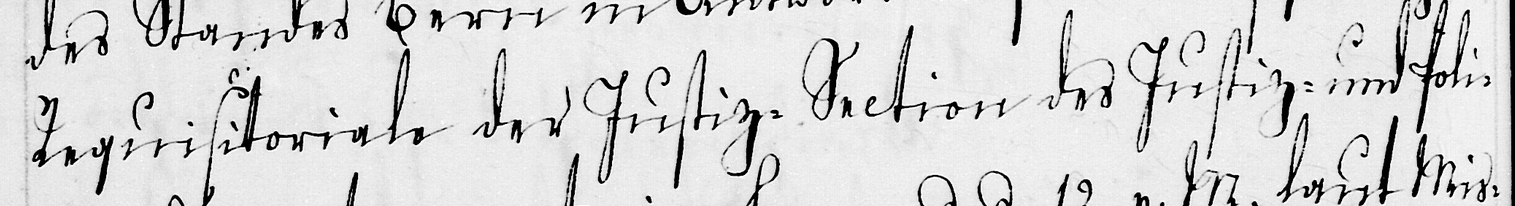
Requisitoriale der Justiz-Section des Justiz- und Pol¬
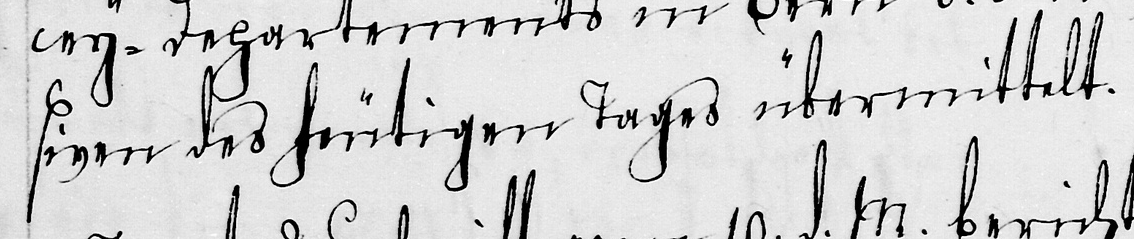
ßiven des heutigen Tages übermittelt.
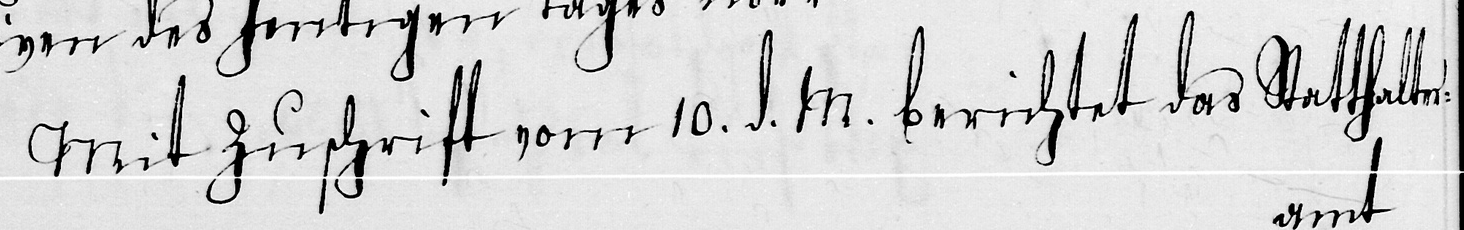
Mit Zuschrift vom 10. d. M. berichtet das Statthal¬
